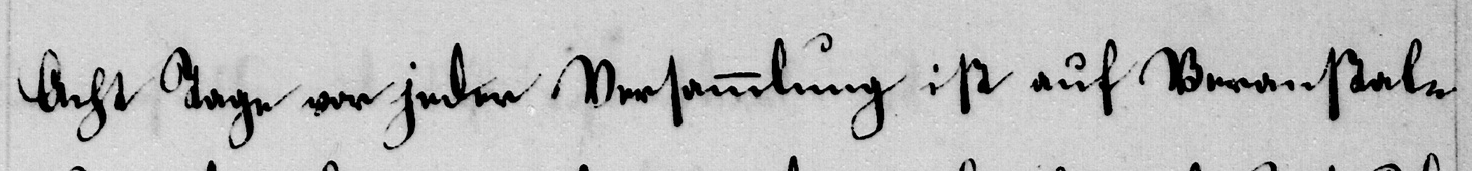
Acht Tage vor jeder Versammlung ist auf Veranstal¬
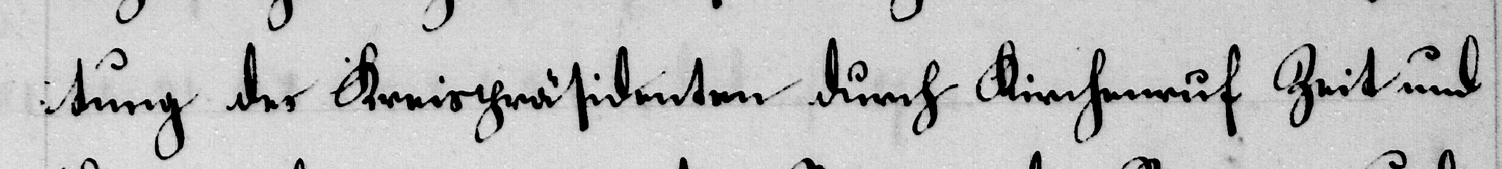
tung der Kreispräsidenten durch Kirchenruf Zeit und
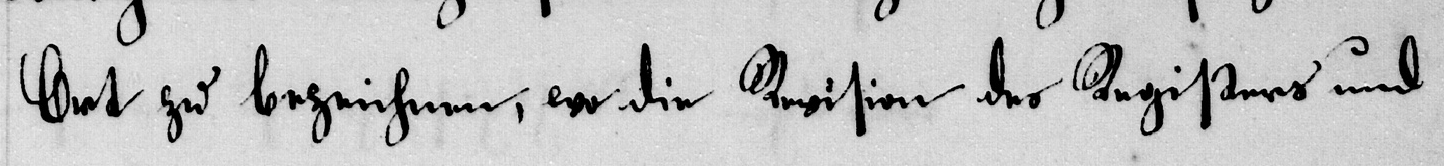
Ort zu bezeichnen, wo die Revision des Registers und
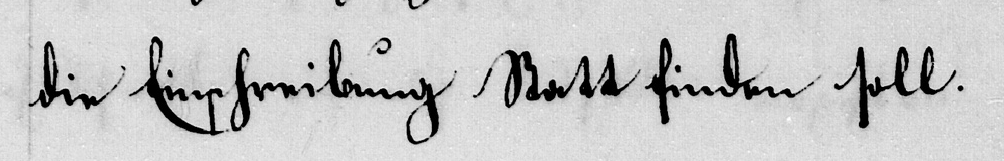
die Einschreibung Statt finden soll.
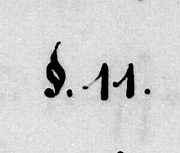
§.11.
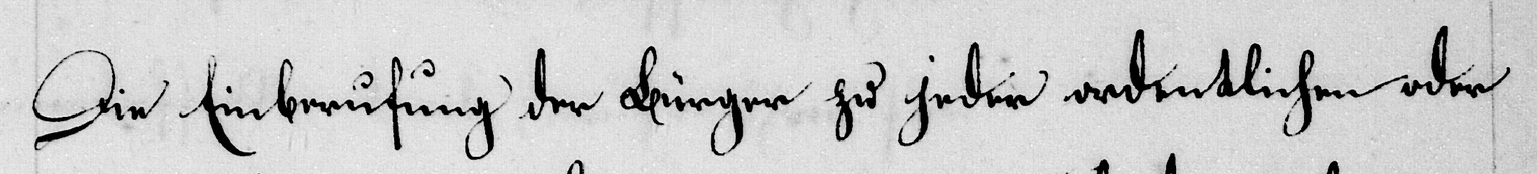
Die Einberufung der Bürger zu jeder ordentlichen oder
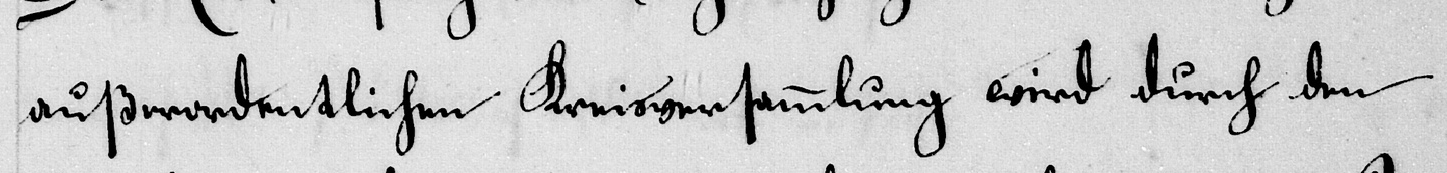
außerordentlichen Kreisversammlung wird durch den
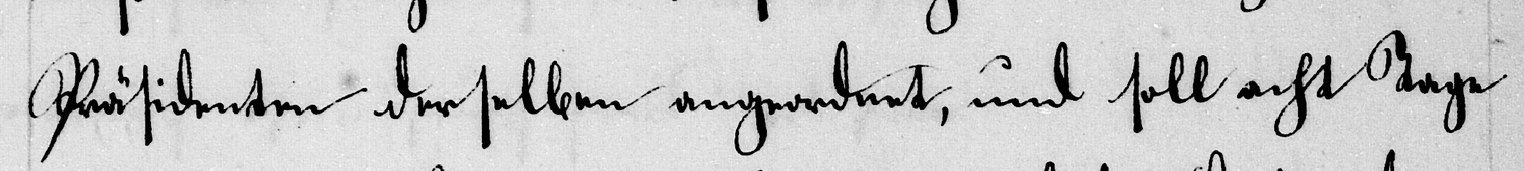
Präsidenten derselben angeordnet, und soll acht Tage
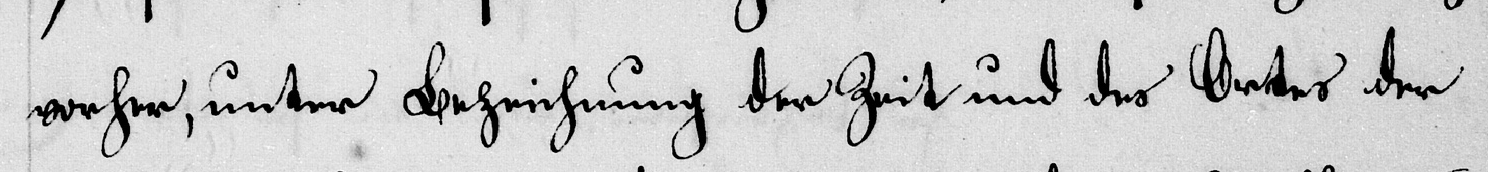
vorher, unter Bezeichnung der Zeit und des Ortes der
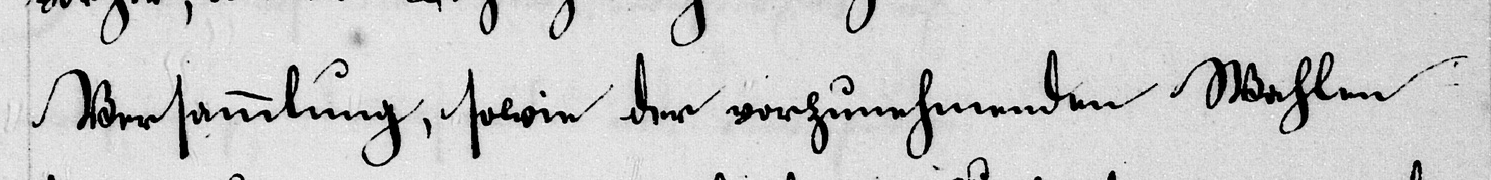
Versammlung, sowie der vorzunehmenden Wahlen
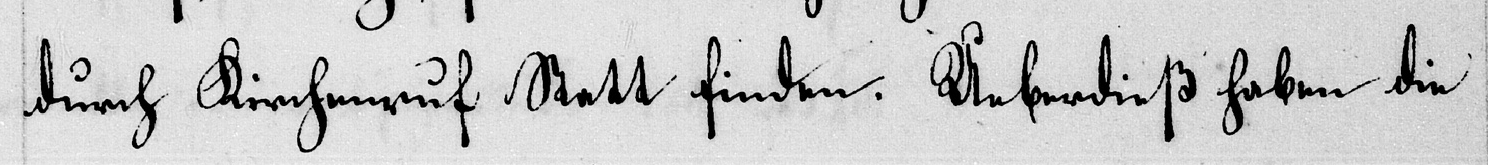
durch Kirchenruf Statt finden. Ueberdieß haben die
